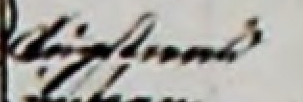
Augstwald
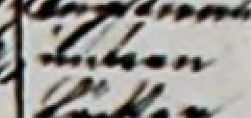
???n
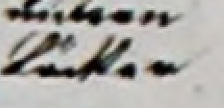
Lücker
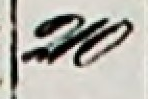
210
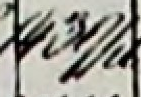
1439/d
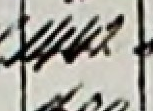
1442
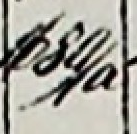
1689/a
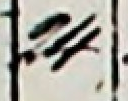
24
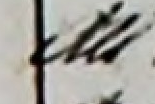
Alt
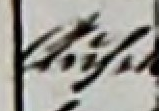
Aus„
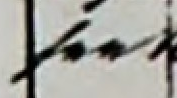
see
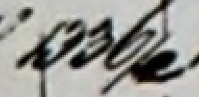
1336/e
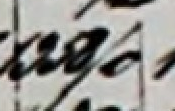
1358/o
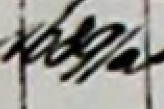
1689/a
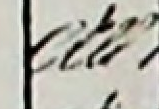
Alt
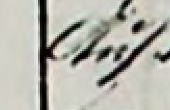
Aus„
